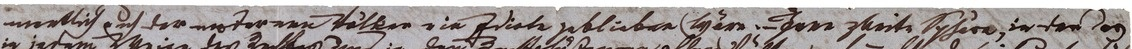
mentlich auch der modernen Völker ein Idiote geblieben wäre. – Jene zweite Sphäre, in der das
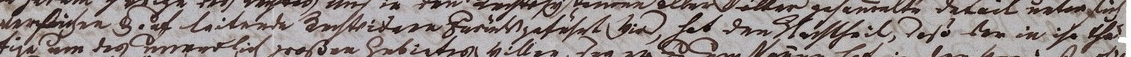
verglichen & auf leitende Rechtsideen zurückgeführt wird, hat den Nachtheil, daß der in ihr thä-
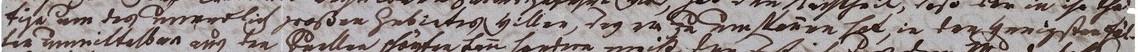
tige um des unendlich großen Gebietes willen, das er zu umspannen hat, in den wenigsten Fäl-
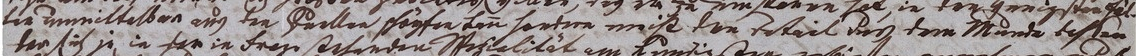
len unmittelbar aus den Quellen schöpfen kann sondern meist den Detail aus dem Munde dessen
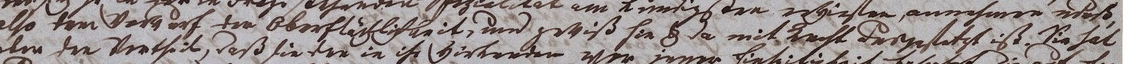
also dem Vorwurf der Oberflächlichkeit, und gewiß hie & da mit Recht ausgesetzt ist. Sie hat
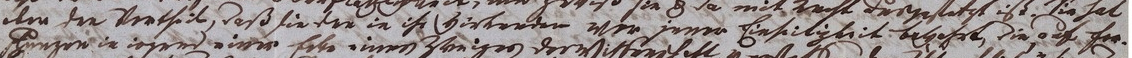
aber den Vortheil, daß sie den in ihr wirkenden vor jener Einseitigkeit bewahrt, die, auf For-
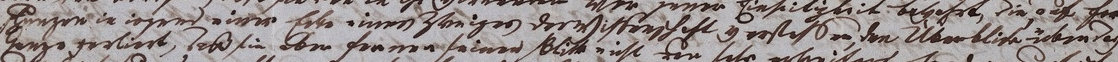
schungen in irgend einer Ecke eines Zweiges der Wissenschaft verstossen, den Überblick über das
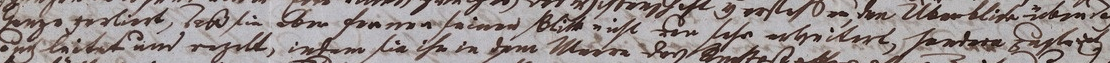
Ganze verliert, daß sie aber ferner seinen Blick nicht nur sehr erweitert, sondern zugleich
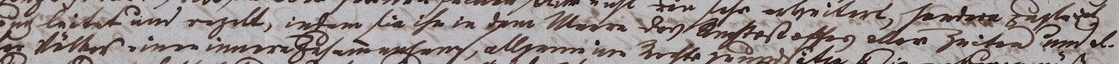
auch leitet und regelt, indem sie ihn in dem Meere des Rechtsstoffes aller Zeiten und al-
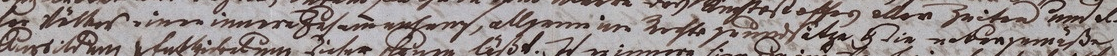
ler Völker einen innern Zusammenhang, allgemeine Rechtsgrundsätze & die naturgemäße
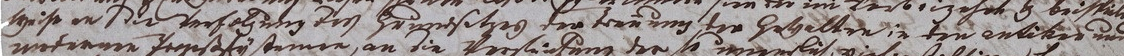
weise an die Verfolgung des Grundsatzes der Trennung der Gewalten in den antiken und
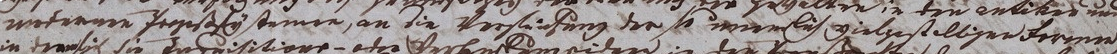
modernen Prozeßsystemen, an die Vergleichung der so unendlich vielgestaltigen Formen,
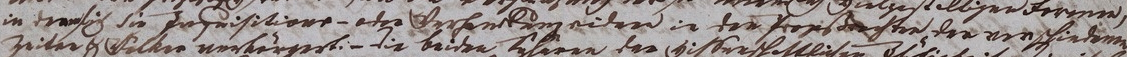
in denen sich die Inquisitions- oder Verhandlungsideen in den Prozeßrechten der verschiedenen
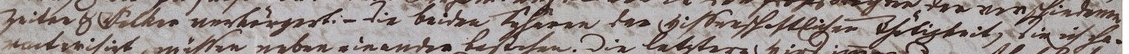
Zeiten & Völker verkörpert. – Die beiden Sphären der wissenschaftlichen Thätigkeit, die ich cha-
